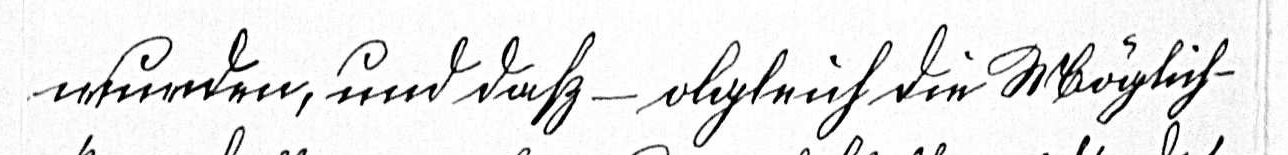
wurden, und daß – obgleich die Möglich¬
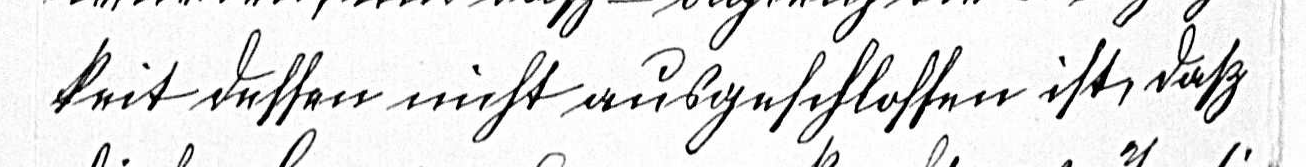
keit dessen nicht ausgeschlossen ist, daß
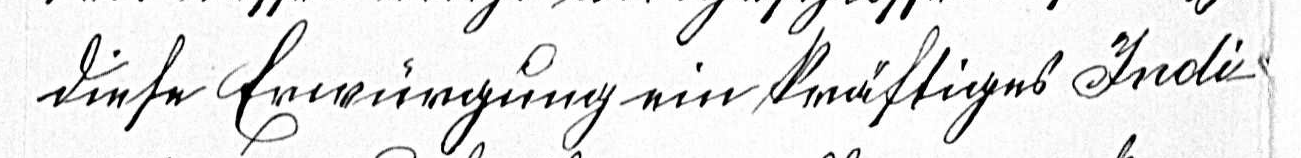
diese Erwürgung ein kräftiges Indi¬
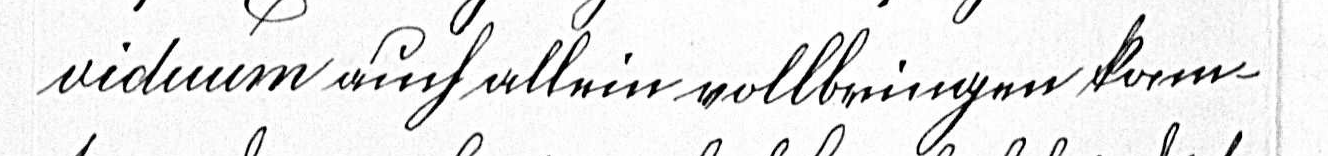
viduum auch allein vollbringen konn¬
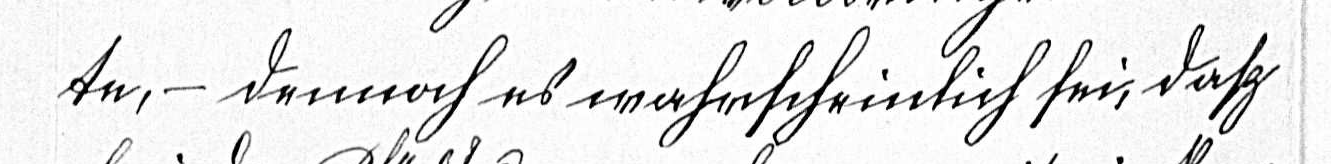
te, -- dennoch es wahrscheinlich sei, daß
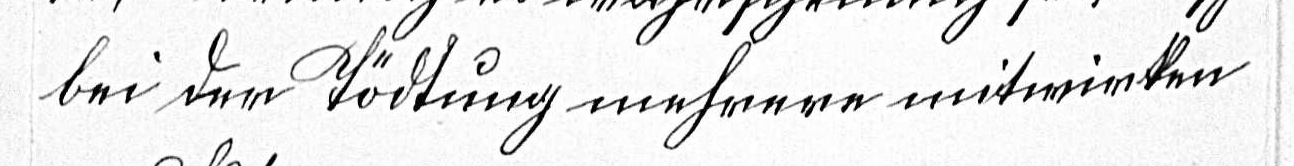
bei der Tödtung mehrere mitwirken
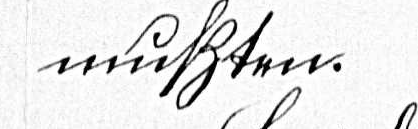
mußten.
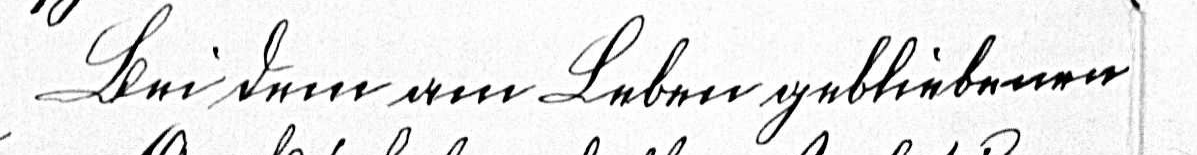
Bei dem am Leben gebliebenen
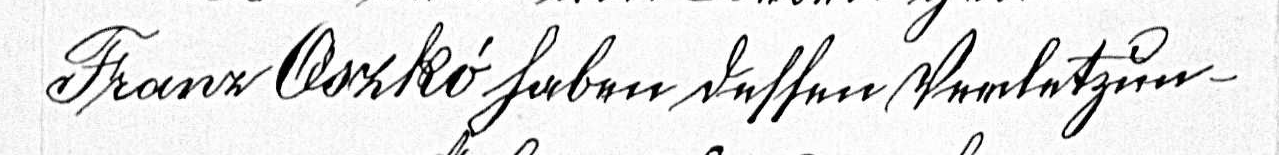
Franz Oszkó haben dessen Verletzun¬
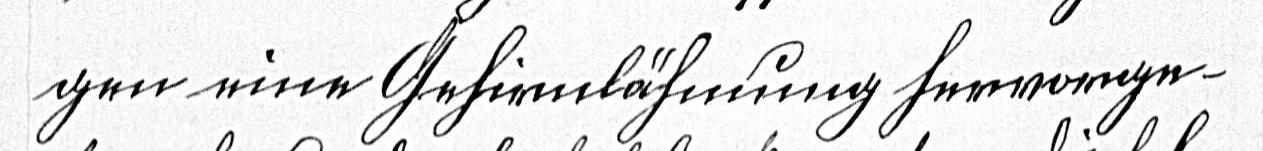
gen eine Gehirnlähmung hervorge¬
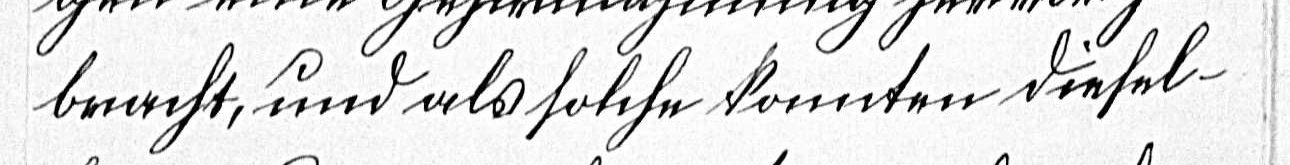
bracht, und als solche konnten diesel¬
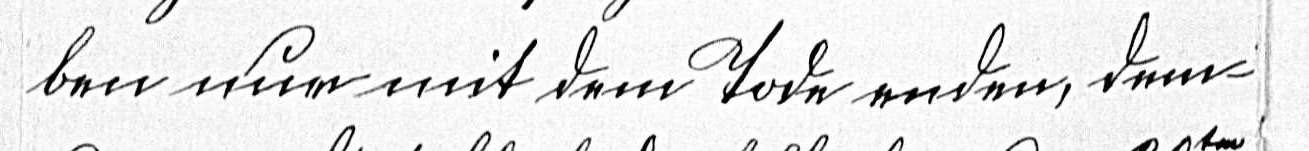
ben nur mit dem Tode enden, dem¬
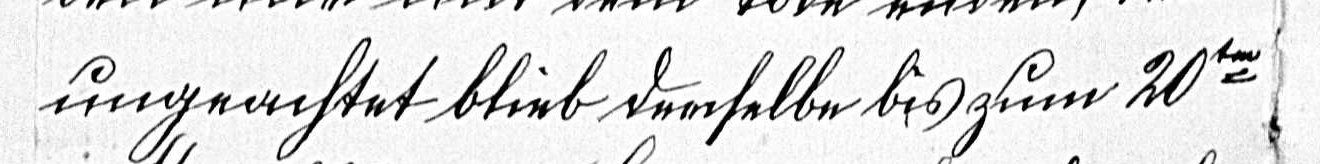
ungeachtet blieb derselbe bis zum 20ten
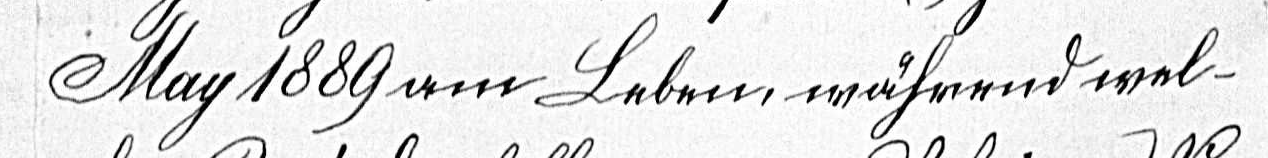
May 1889 am Leben, während wel¬
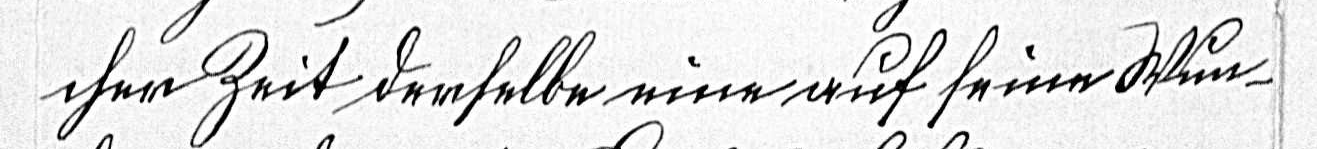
cher Zeit derselbe eine auf seine Wun¬
